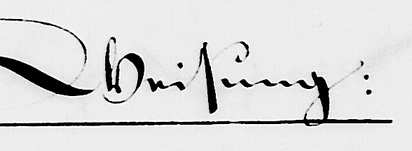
Weisung:
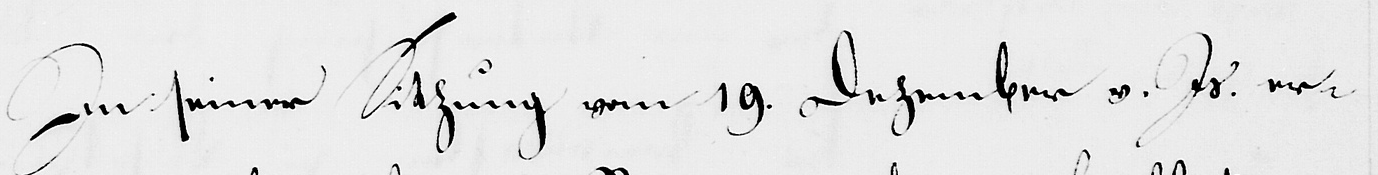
In seiner Sitzung vom 19. Dezember v. Js. er¬
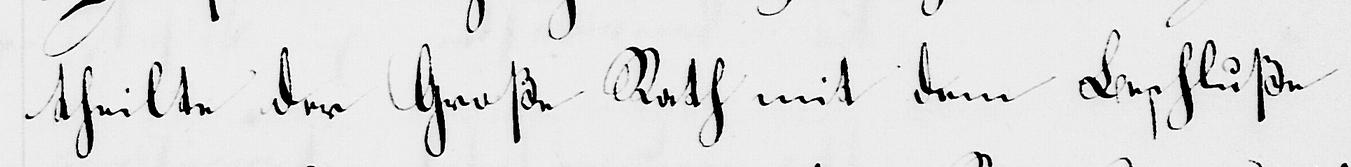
theilte der Große Rath mit dem Beschluße
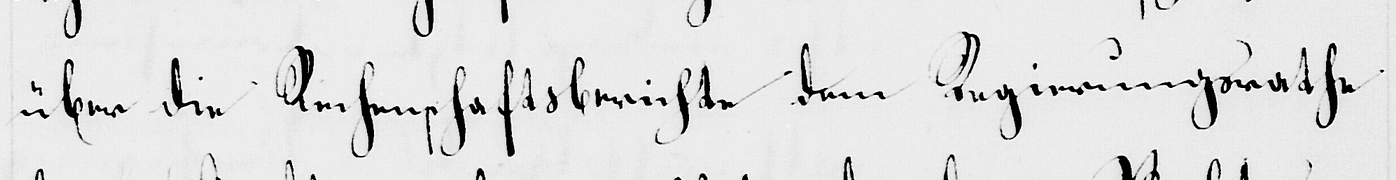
über die Rechenschaftsberichte dem Regierungsrathe
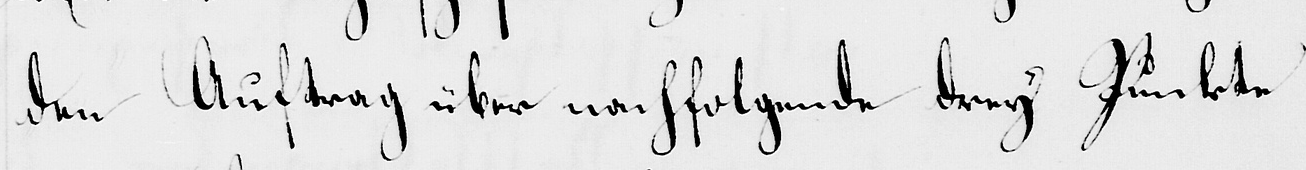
den Auftrag über nachfolgende drey Punkte
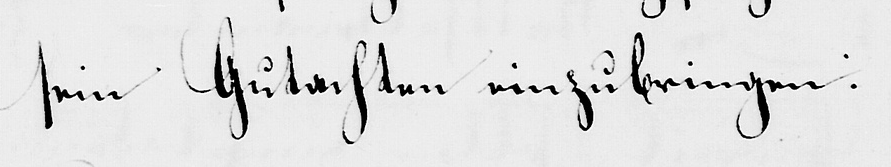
sein Gutachten einzubringen:
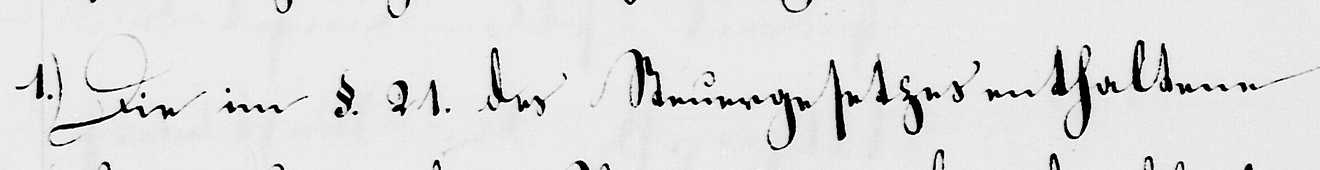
1.) Die im §. 21. des Steuergesetzes enthaltene
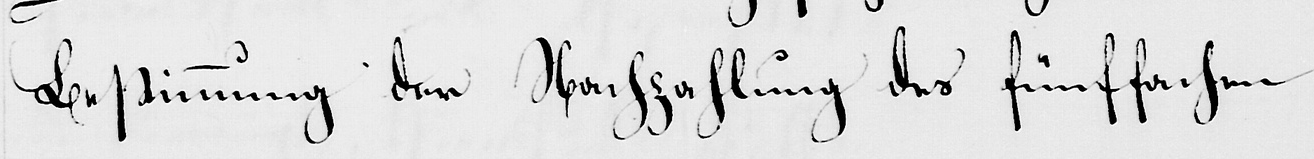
Bestimmung der Nachzahlung des fünffachen
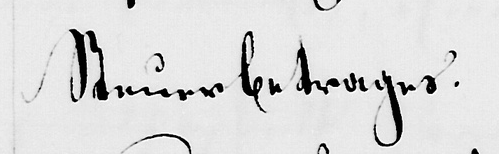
Steuerbetrages.
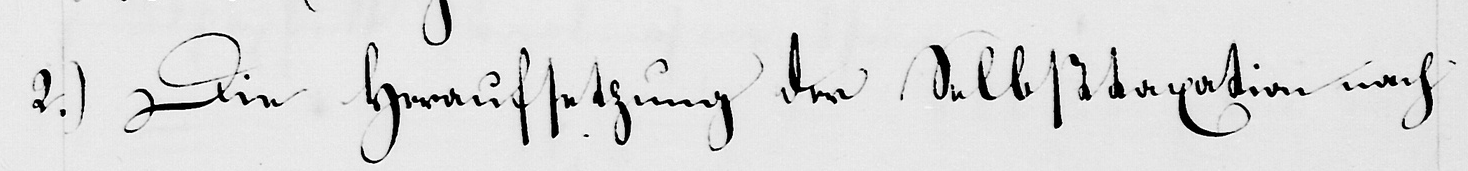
2.) Die Heraufsetzung der Selbsttaxation nach
